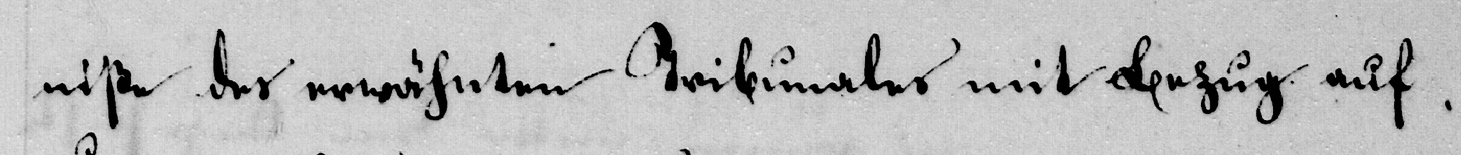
niße des erwähnten Tribunales mit Bezug auf
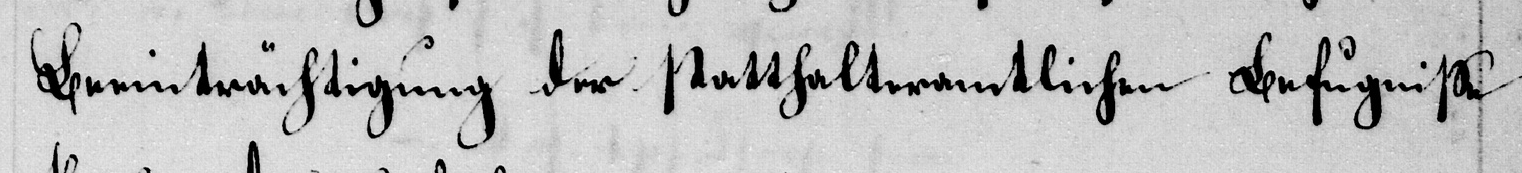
Beeinträchtigung der statthalteramtlichen Befugniße
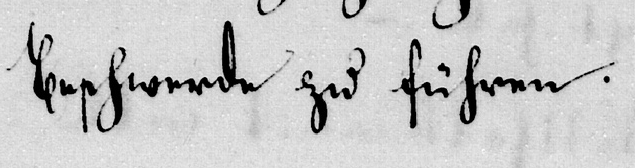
Beschwerde zu führen.
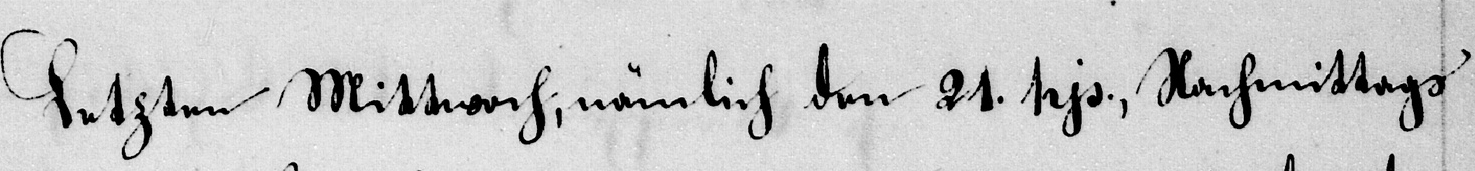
Letzten Mittwoch, nämlich den 21. hjs., Nachmittags
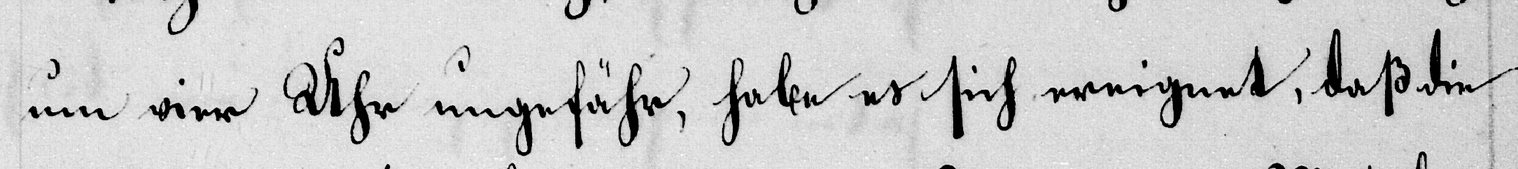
um vier Uhr ungefähr, habe es sich ereignet, daß die
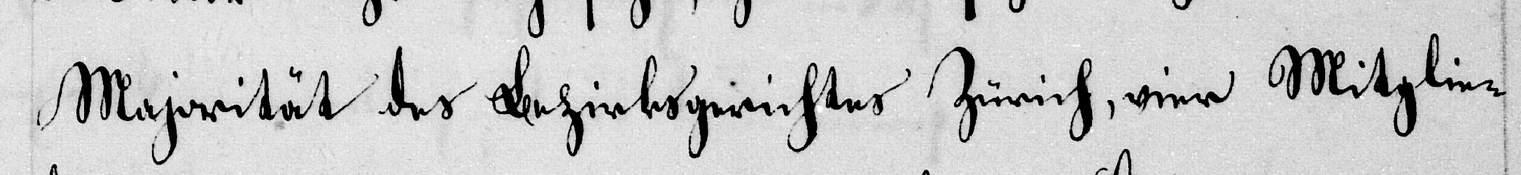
Majorität des Bezirksgerichtes Zürich, vier Mitglie¬
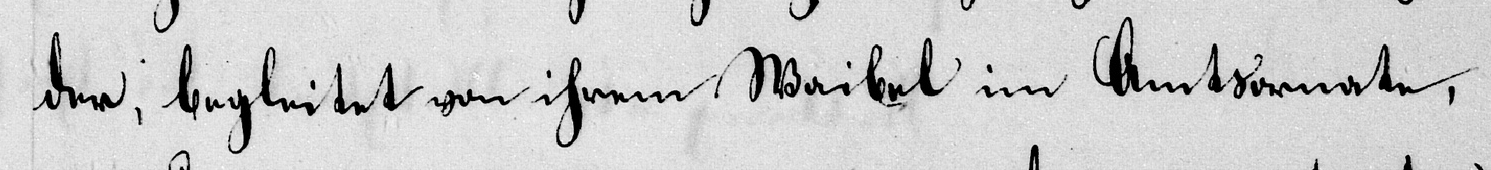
der, begleitet von ihrem Waibel im Amtsornate,
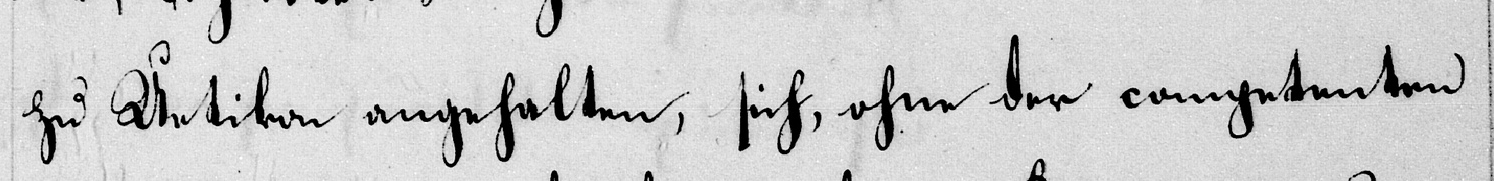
zu Uetikon angehalten, sich, ohne der competenten
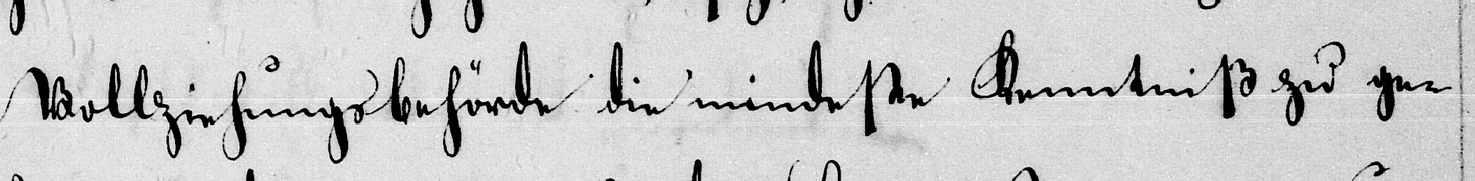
Vollziehungsbehörde die mindeste Kenntniß zu ge¬
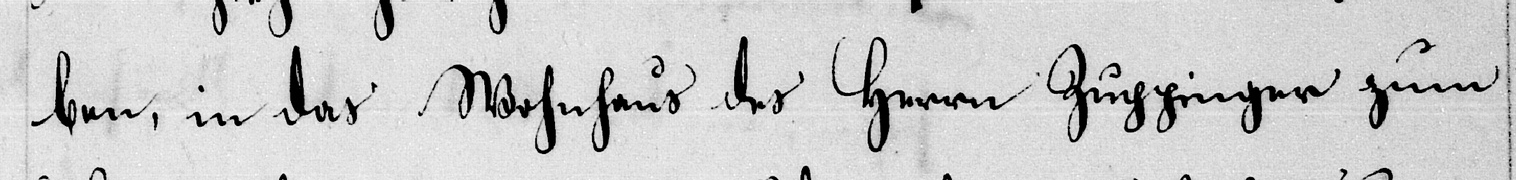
ben, in das Wohnhaus des Herrn Zuppinger zum
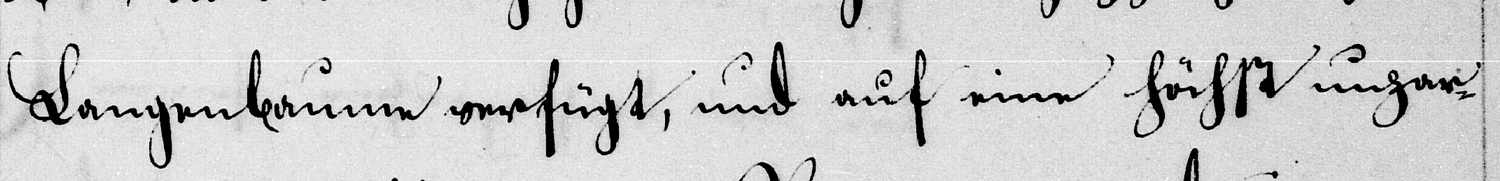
Langenbaum verfügt, und auf eine höchst unzar¬
